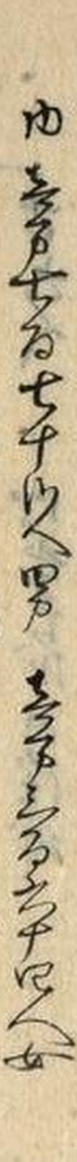内壱万七百七十弐人男壱万三百六十四人女
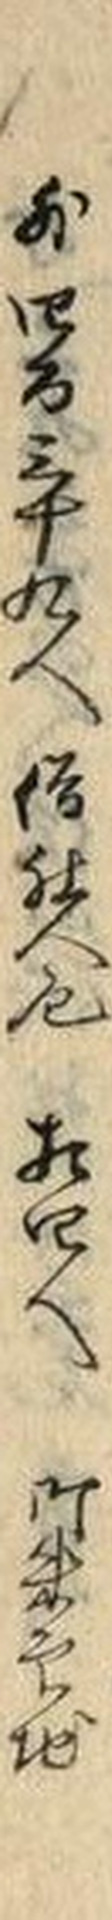外四百三十九人僧社人尼拾四人御朱印地
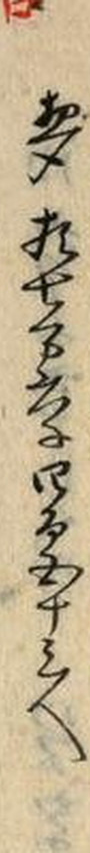惣〆拾七万六千四百五十三人

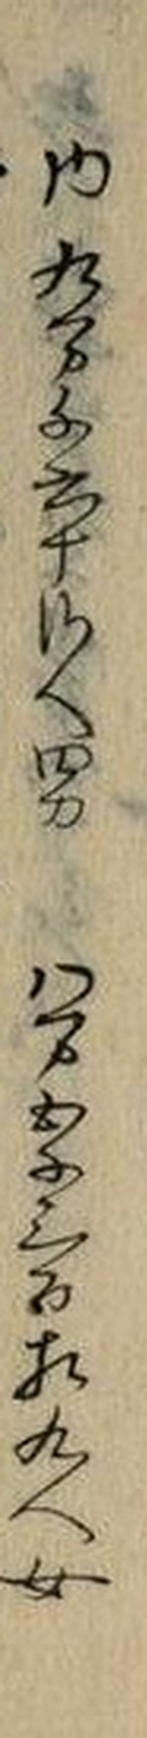内九万千六十弐人男八万五千三百拾九人女
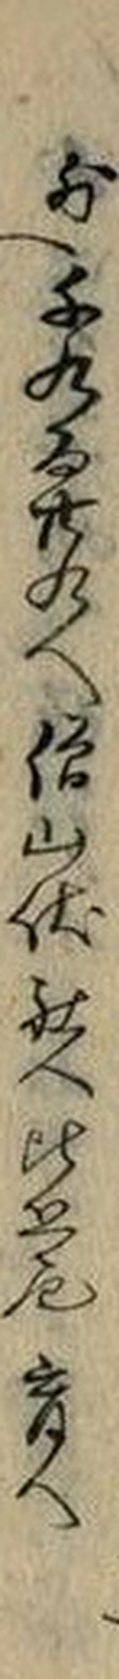外千九百廿九人僧山伏社人比丘尼盲人
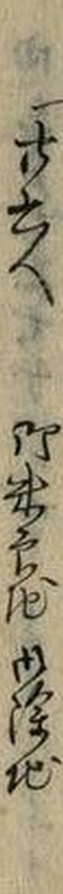廿六人御朱印地御除地
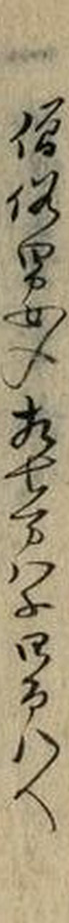僧俗男女〆拾七万八千四百八人
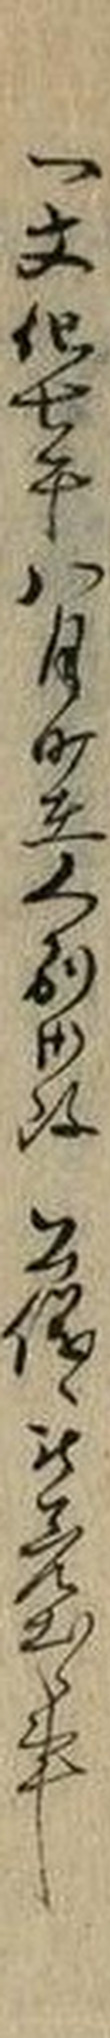一文化七午八月町在人別御改公儀へ被差出候事
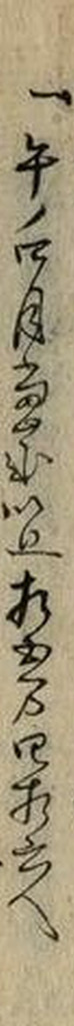一午ノ四月当歳以上拾五万四拾六人
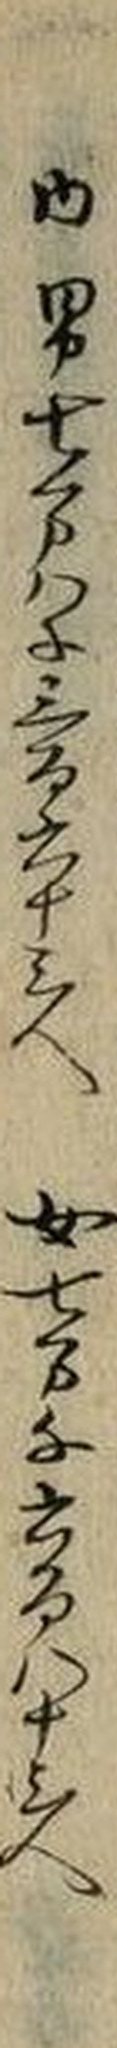内男七万八千三百六十三人女七万千六百八十三人
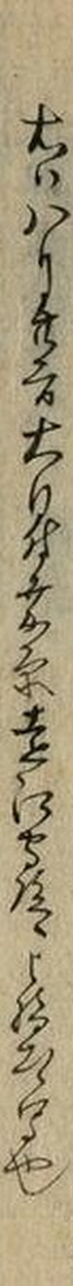右ハ八月廿二日大目付桑原遠江守殿へ被指出候写也
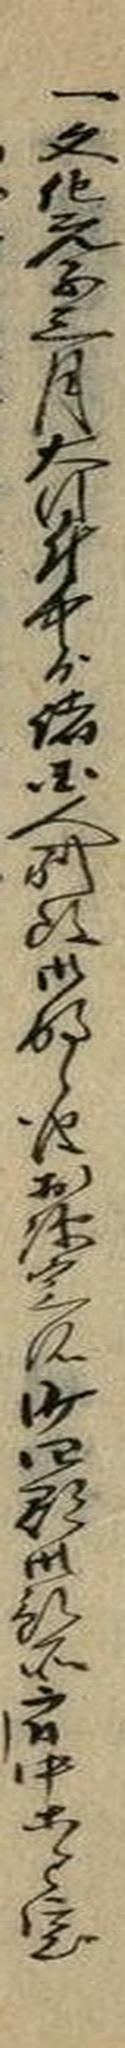一文化元子三月大目付中ゟ諸国人別改御触之儀於評定所町四郡御領所府中等へ被仰出
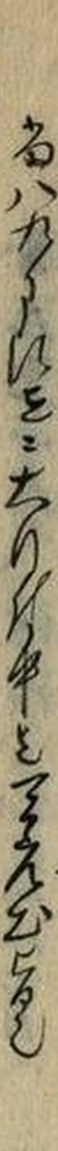当八九月頃迄ニ大目付中迄可差出旨也
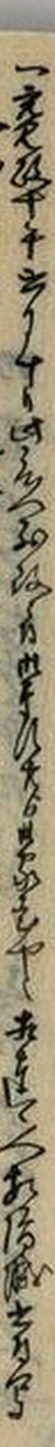一寛政十午六月十日此度人別改ニ付御奉行共ゟ御家老中へ相達候人数増減書付写
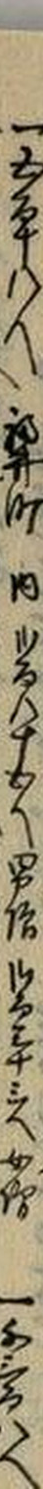一五百十八人福井町内弐百八十五人男増弐百三十三人女増
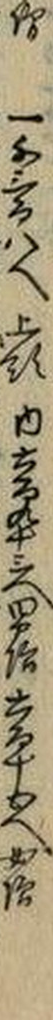一千三百八人上領内六百九十三人男増六百十五人女増
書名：御国他国諸事之部
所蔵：福井県文書館 Fukui Prefectural Archives
